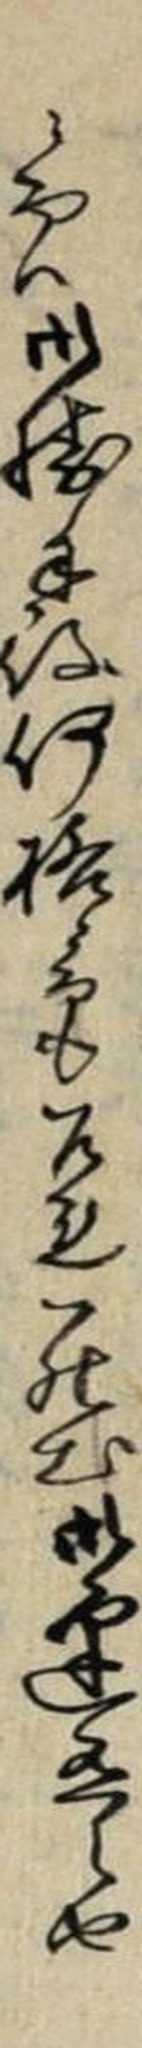にては御勝手役何格にても召連罷出御逢有之由
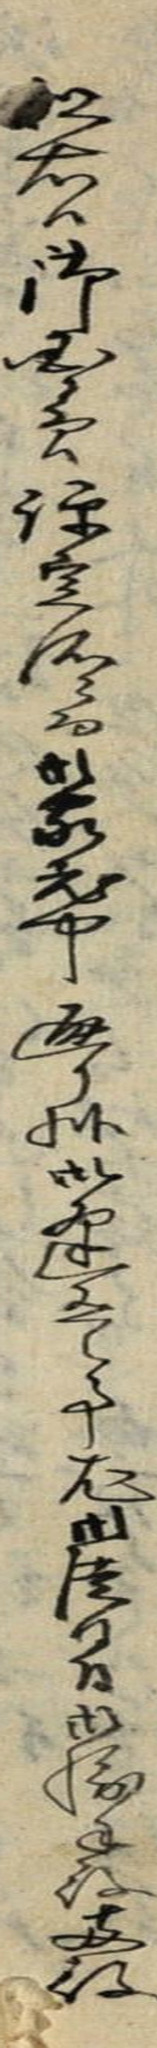但右は御国にては評定所にて御家老中通り掛御逢有之事尤御徒目付御勝手役両役
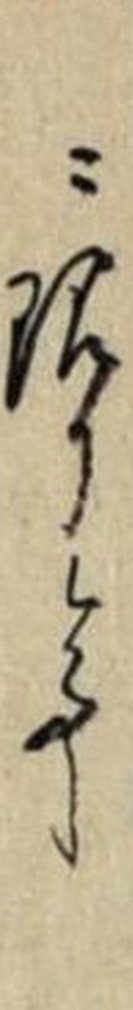に限り候事
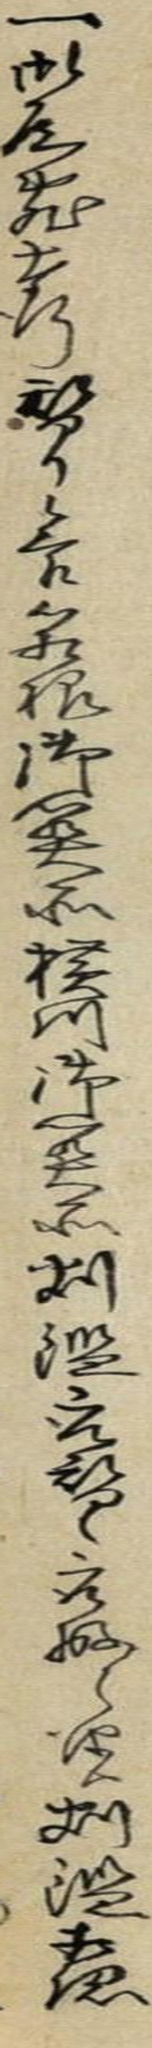一御屋敷奉行替り候節箱根御関所横川御関所判鑑取替之取扱之儀は判鑑相認
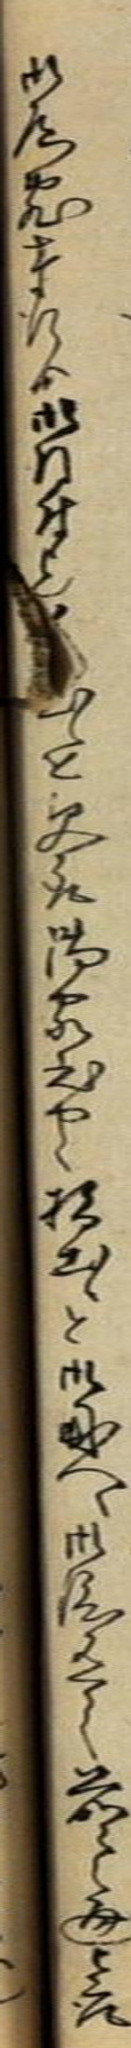御屋敷奉行ゟ御目付迄候を受取御家老中へ指出候と御用人へ御渡有之前々之通被取
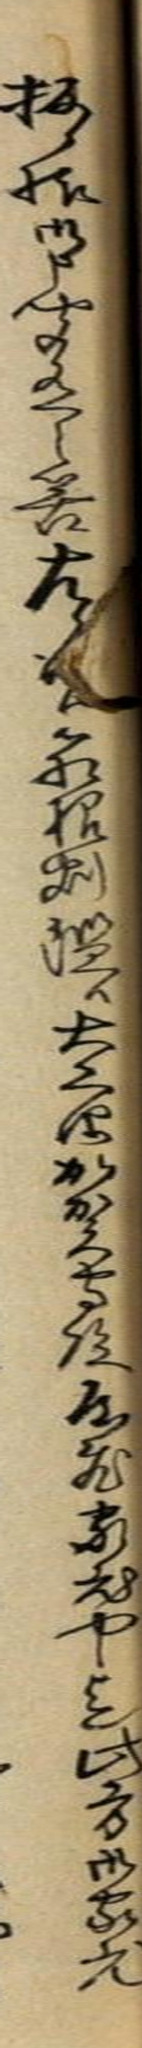扱候様御申聞有之筈左候得は箱根判鑑は大久保加賀守殿屋敷家老中迄此方御家老
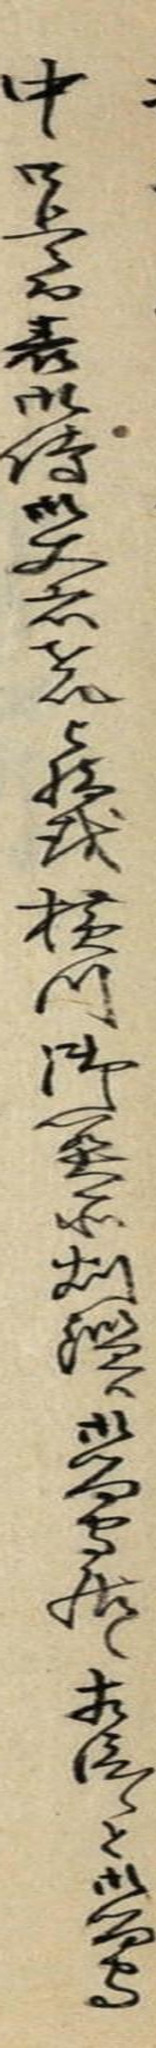中口上にて表御侍御使者を以被指越横川御関所判鑑は御留守居へ相渡候と御留守
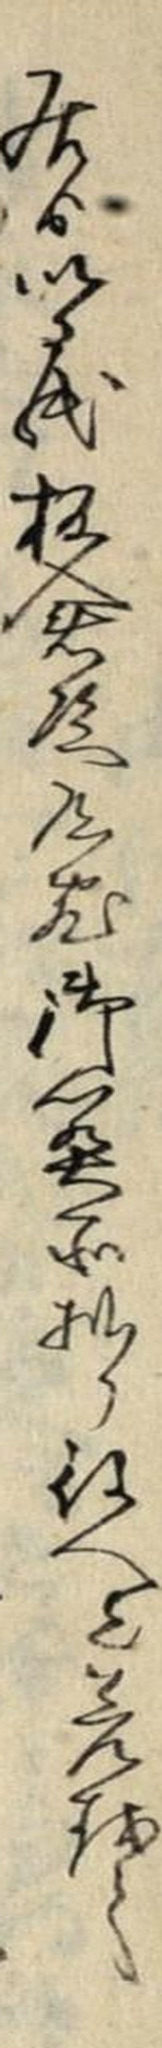居ゟ以手紙板倉殿屋敷御関所掛り役人迄差越之
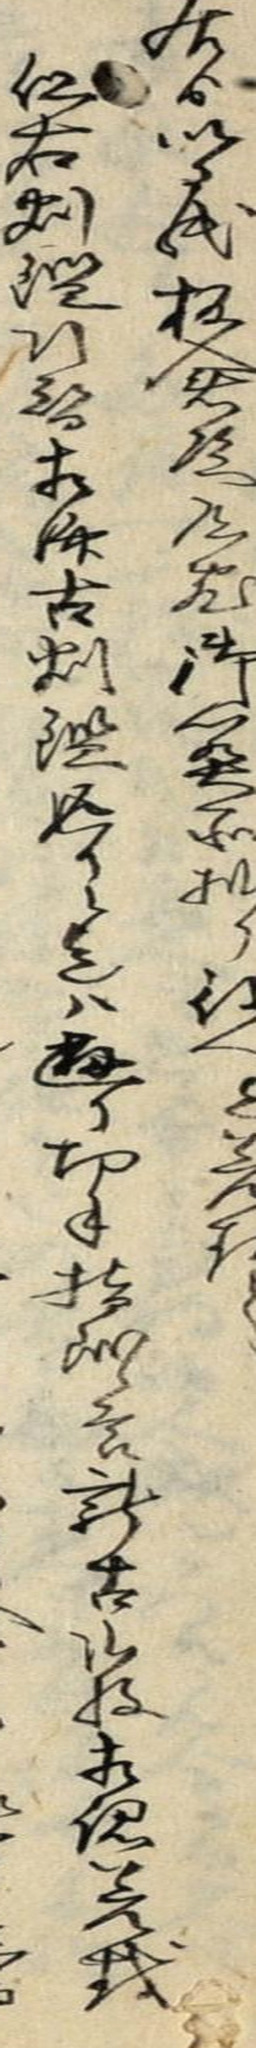但右判鑑引替相済古判鑑返り候迄は通り切手指越候節新古弐枚相認差越
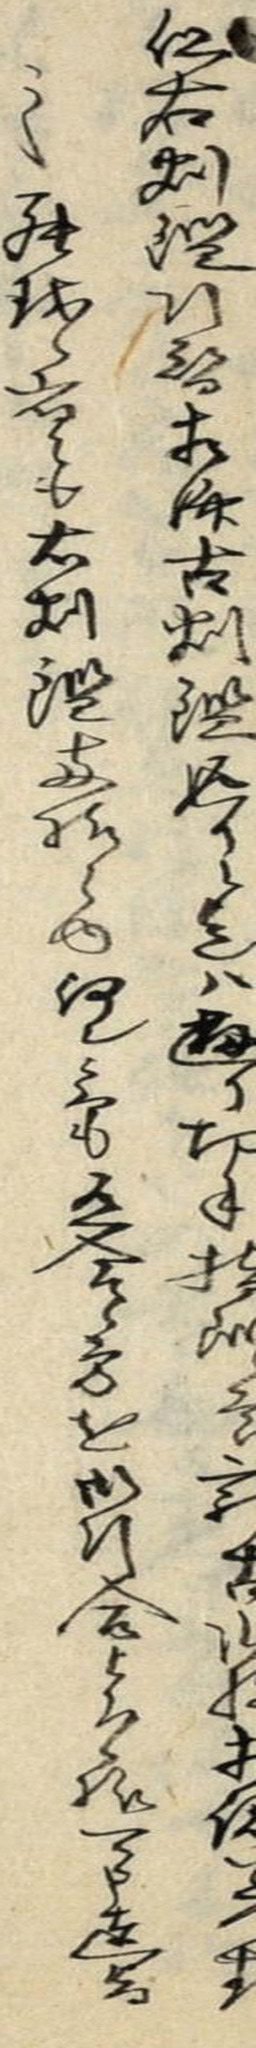之罷越候者にも右判鑑両様之内何れにても有合候方を御引合被下候様可申達旨
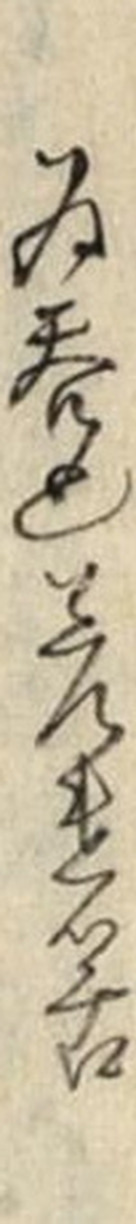為呑込差遣筈
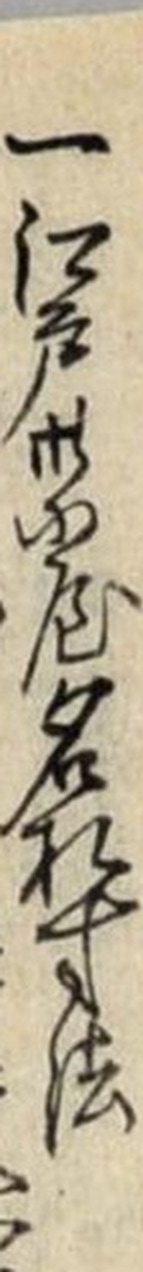一江戸御小屋名札寸法
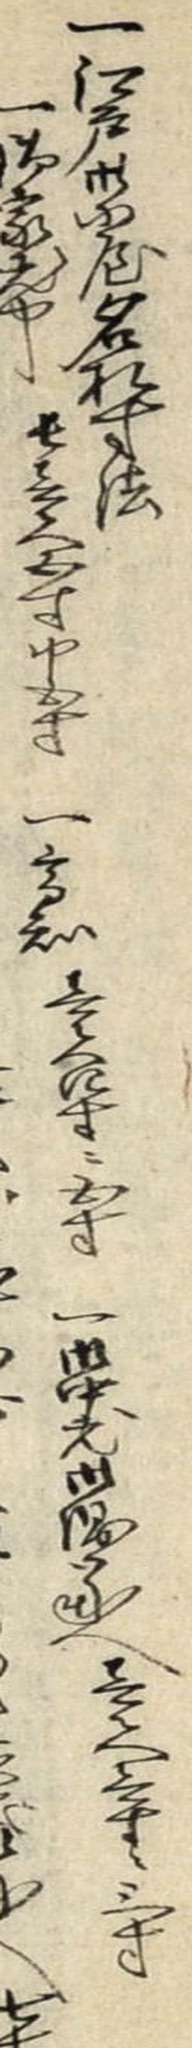一御家老中長壱尺五寸巾五寸一高知壱尺四寸に五寸一御中老御側御用人壱尺壱寸に三寸

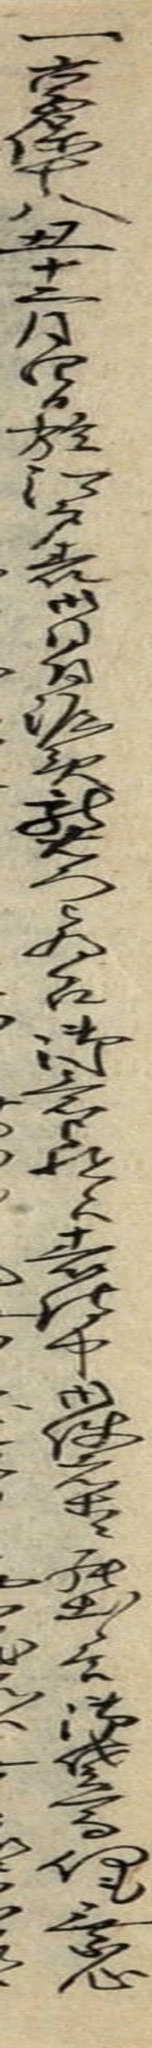一享保十八丑十二月四日於江戸表御目付渥美新右衛門被為召御意被遊候は表侍中御使者等に罷出候節御貸馬何も乗心
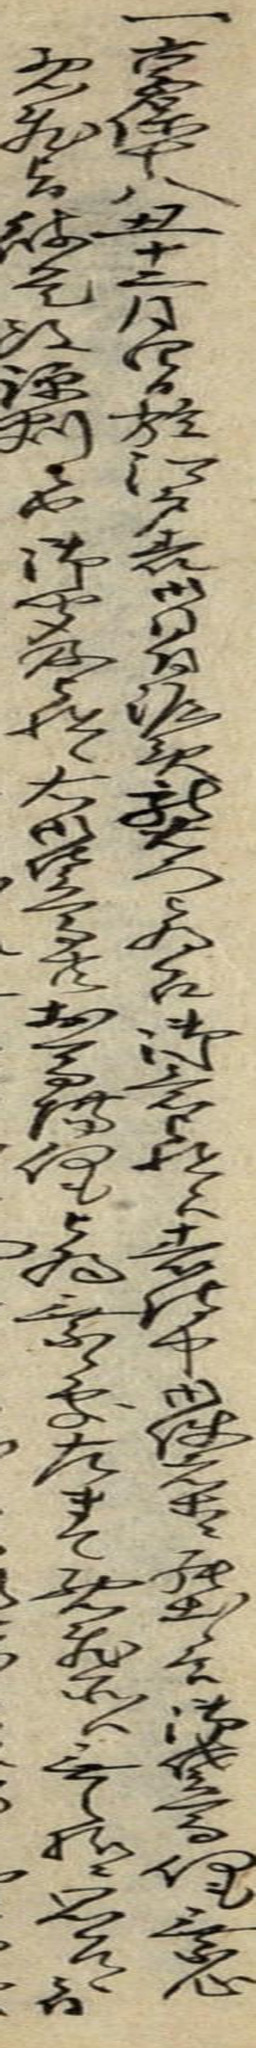悪敷旨彼是致評判候由御聞及被遊候右御貸馬共於馬場何も被為乗候処左まて悪敷所は無之様に思召候に付
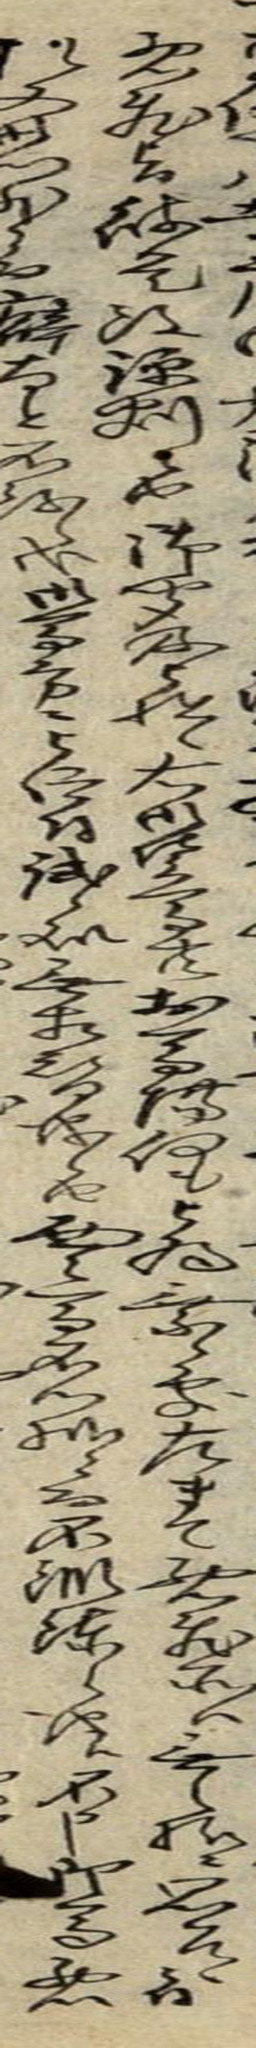猶又御門外にて癖なと不致候哉御馬方に被仰付試候処無相替儀候由面々馬不心掛候て不鍛錬之儀は不申御馬悪
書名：三都并道中之部
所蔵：福井県文書館 Fukui Prefectural Archives
